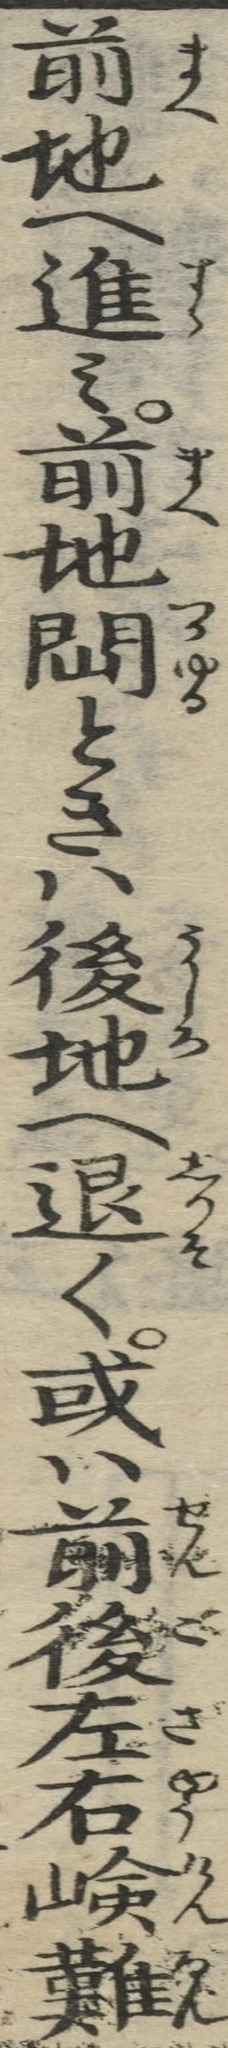前地へ進み。前地閊ときは後地へ退く。或は前後左右」、険難
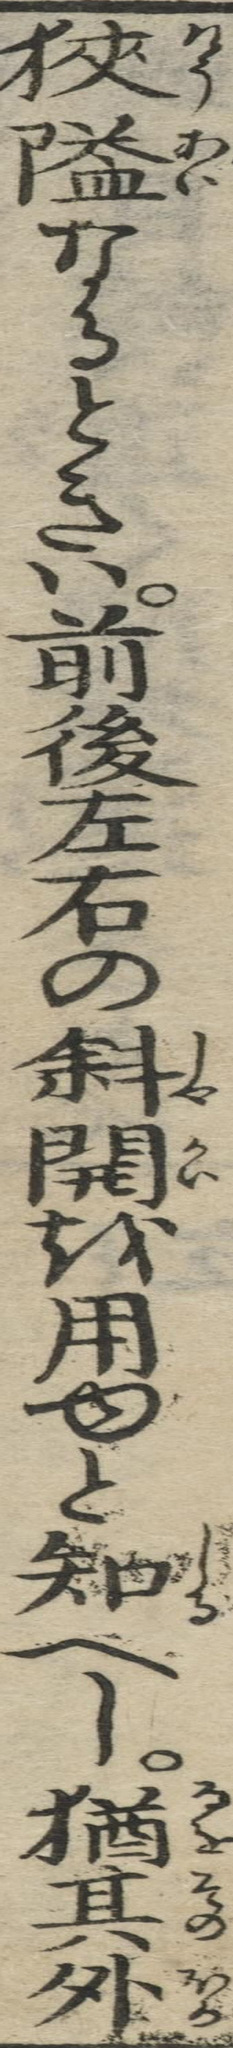狭隘なるときは。前後左右の斜開用ぬと知へし。猶其外
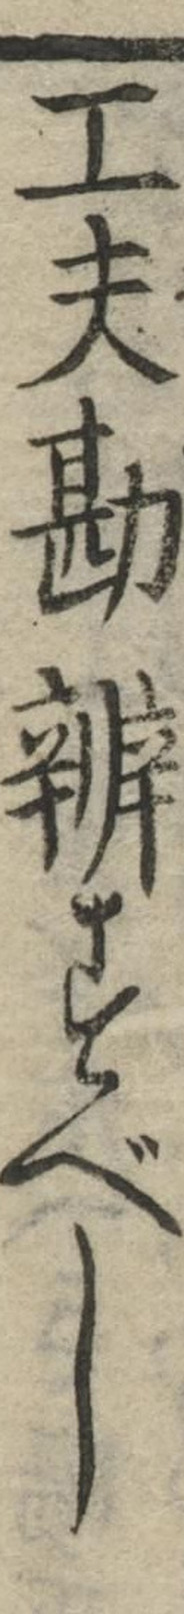工夫勘辨すべし
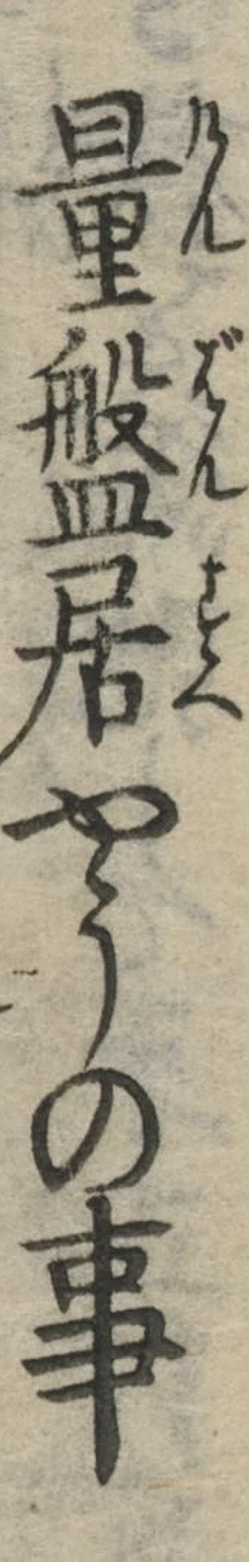量盤居やうの事
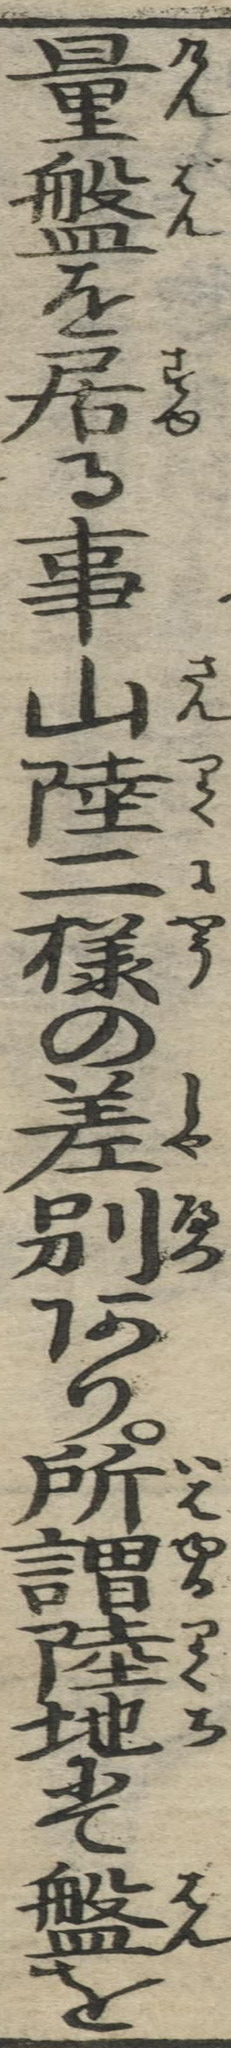量盤を居る事山陸二様の差別あり。所謂陸地にて盤を
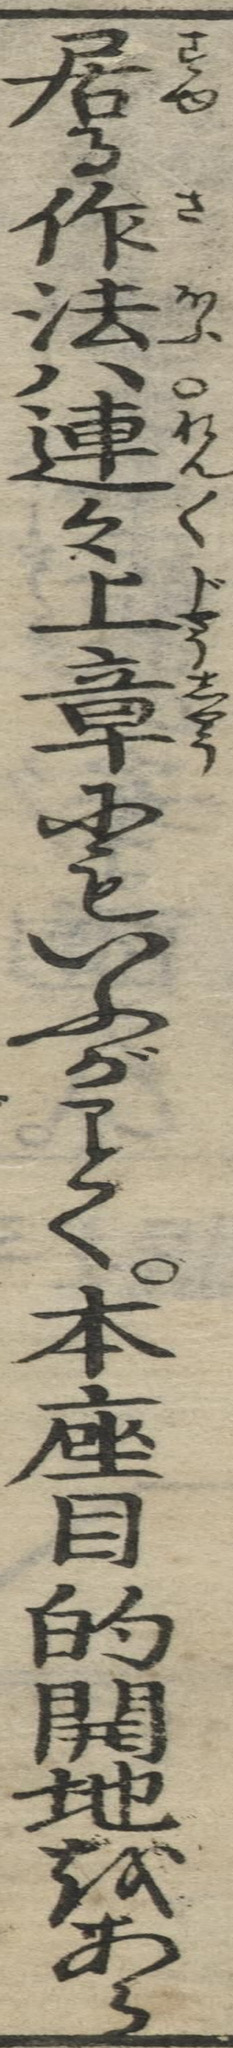居る作法は。連々上章にといふがことく。本座目的開地をあら
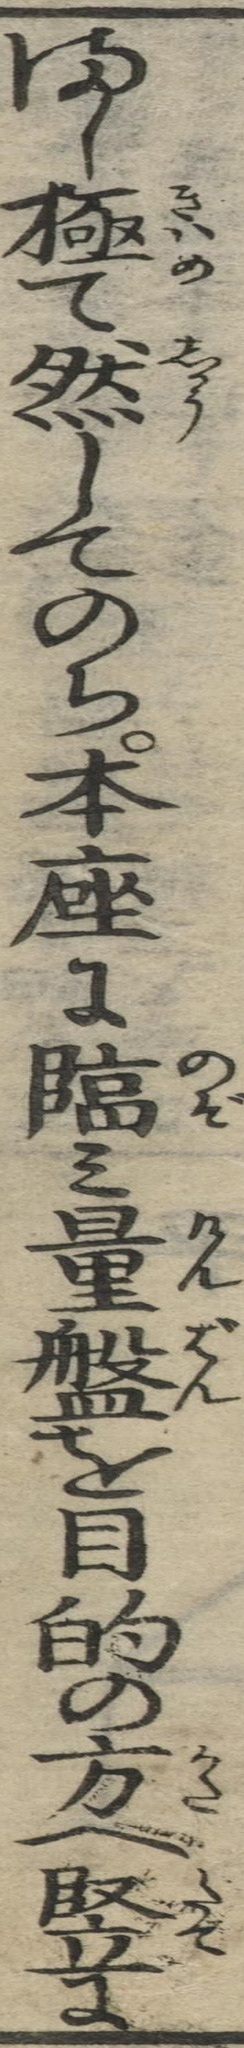まし極て然してのち。本座に臨み量盤を目的の方へ竪に

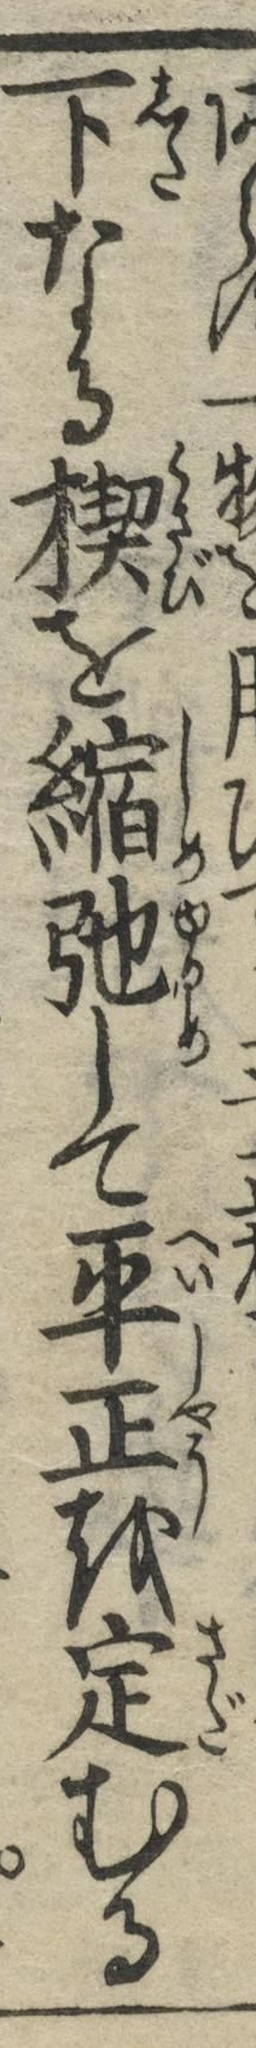下なる楔を縮弛して平正を定むる
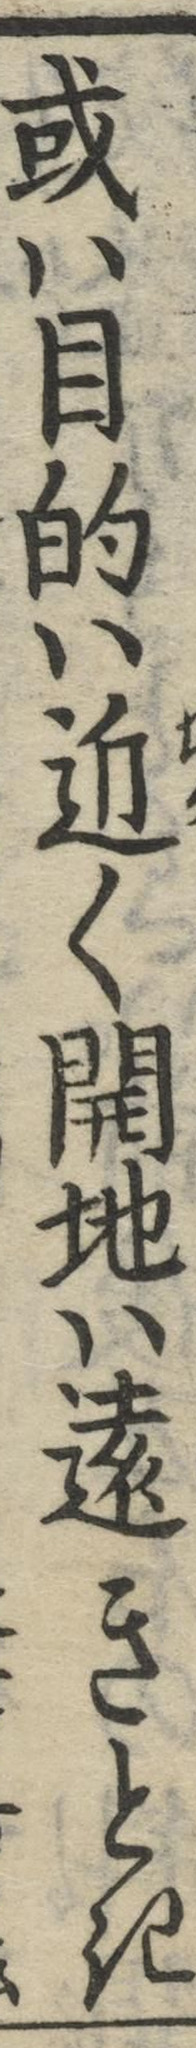或は目的は近く開地は遠きとき立
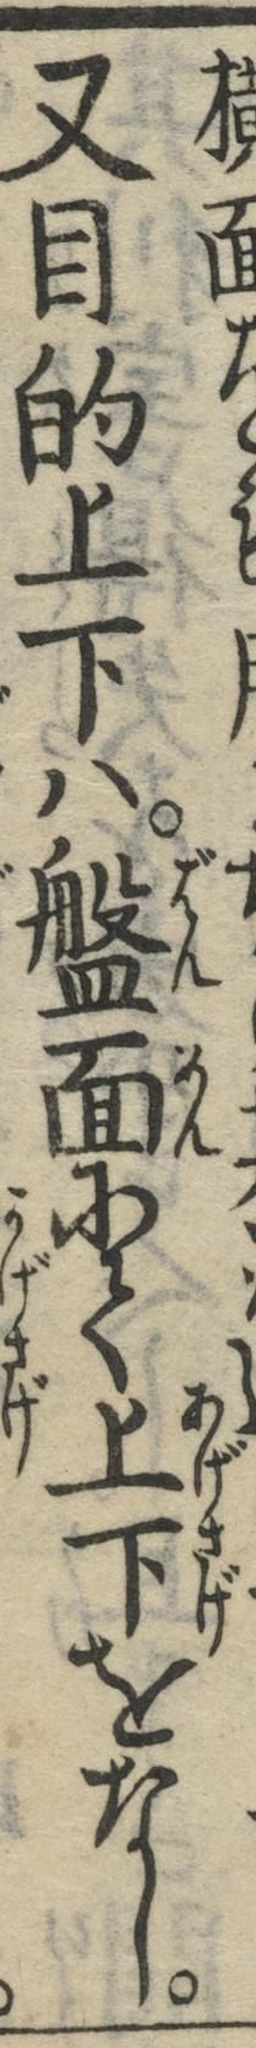又目的上下は。盤面にて上下をなし。図
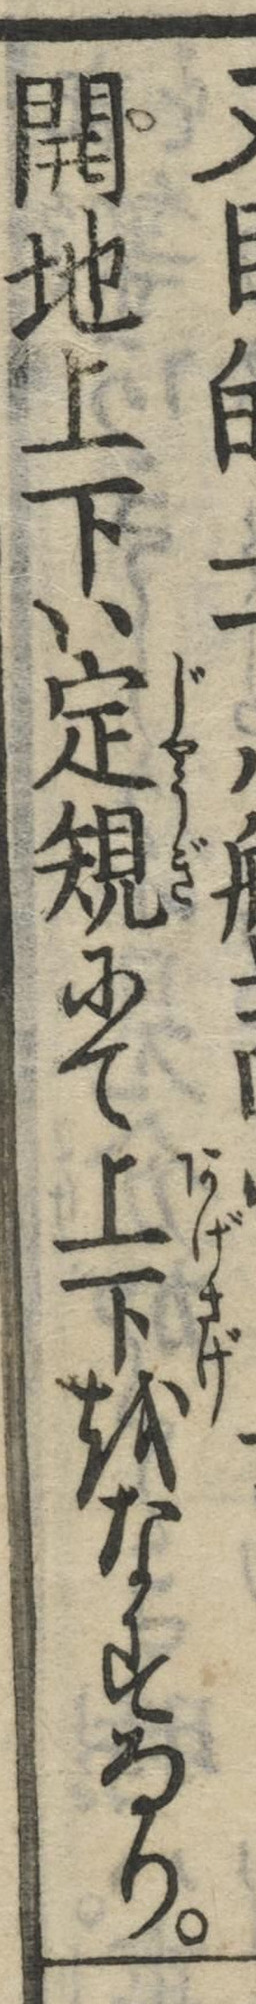開地上下は定規にて上下なすなり。
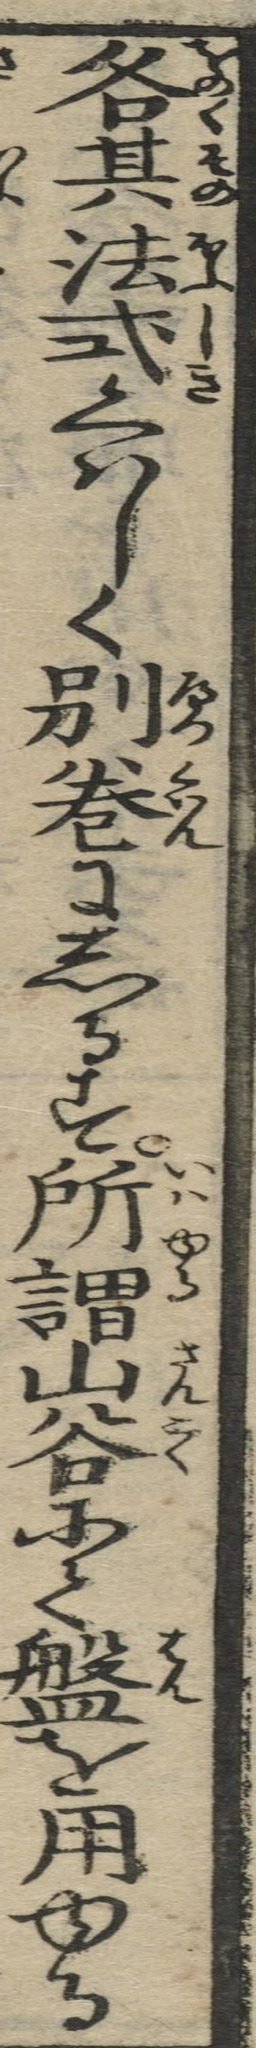各其法式くはしく別巻にしるす。所謂山谷にて盤を用ゆる
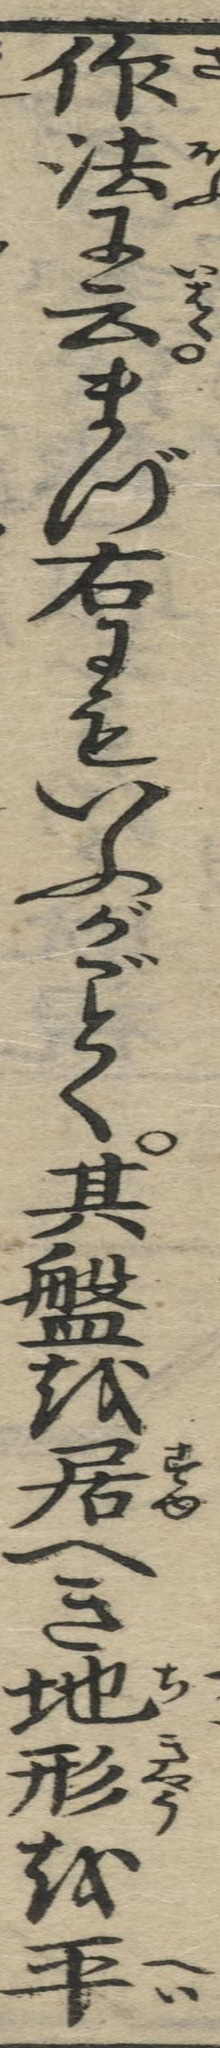作法に云。まづ右にもいふがごとく。其盤を居へき地形を用ゆる
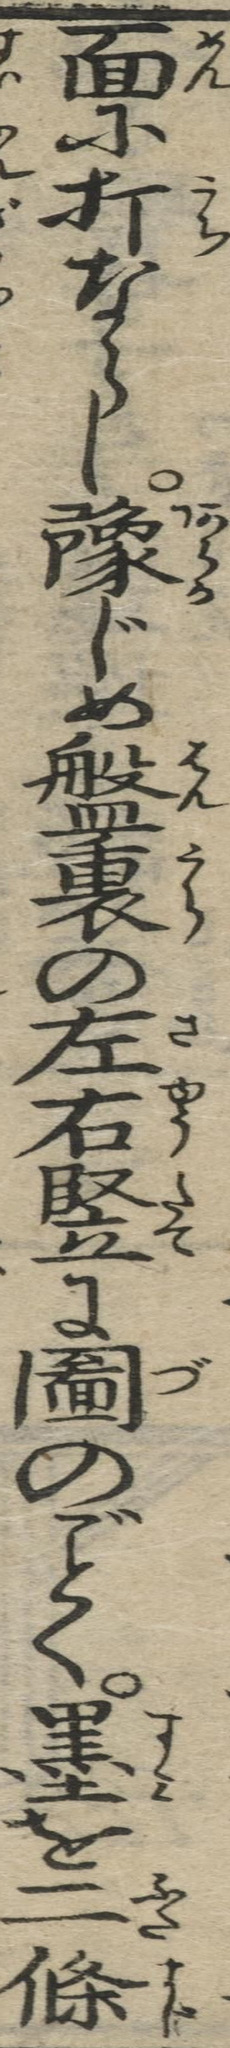面に打ならし。予じめ盤裏の左右竪に図のごとく。墨を二条
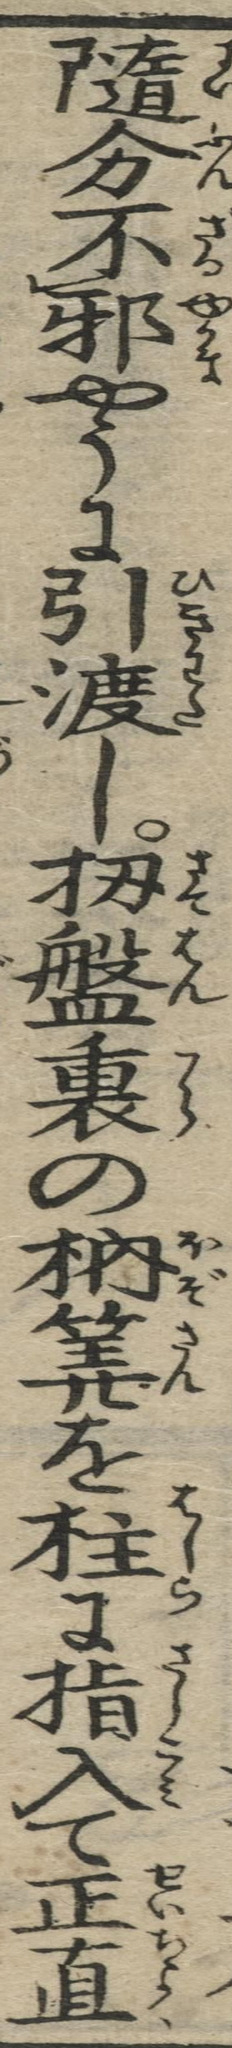随分不邪やうに引渡し。扨盤裏の枘算を柱に指入て正直
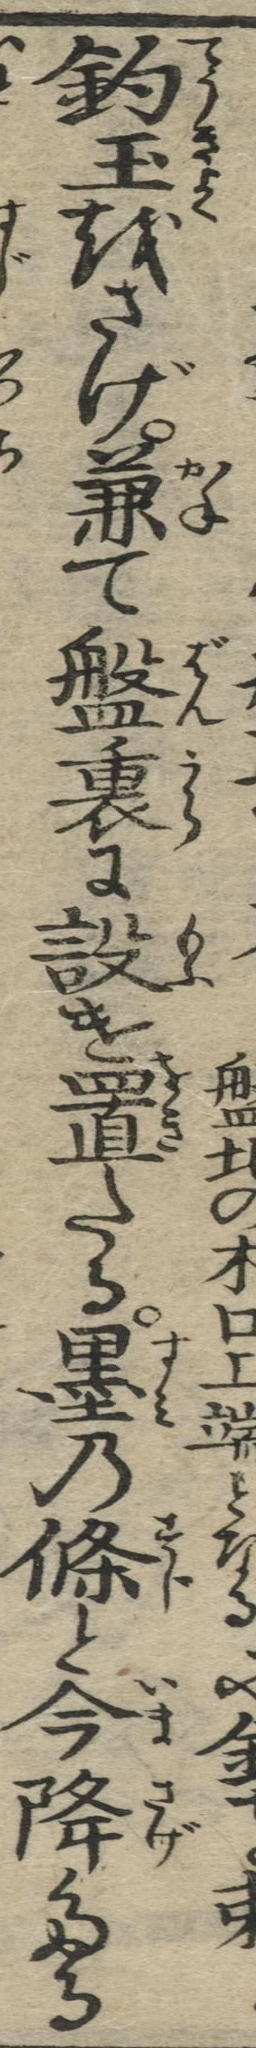釣玉をさげ。兼て盤裏に設け置たる。墨乃条と今降たる
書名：量地指南　巻之一（内題）
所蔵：東京大学地震研究所図書室 Earthquake Research Institute Library, The University of Tokyo, JAPAN
